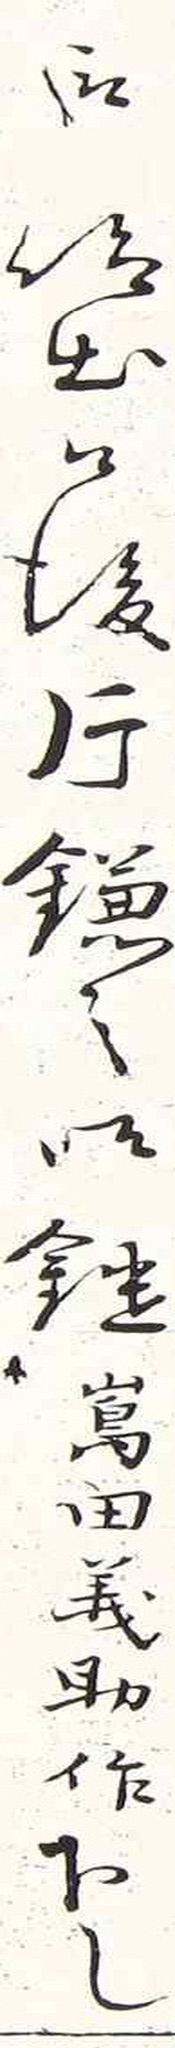被仰出候後片鎌之御鑓島田義助作下し
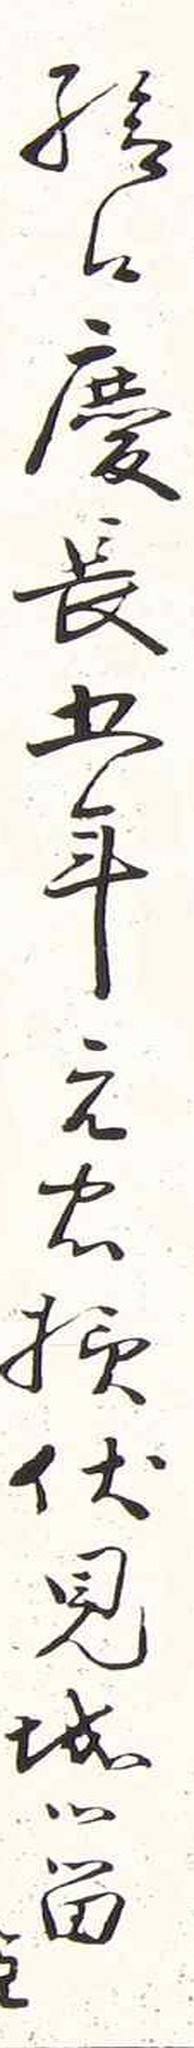給候慶長五年元忠様伏見城御留主
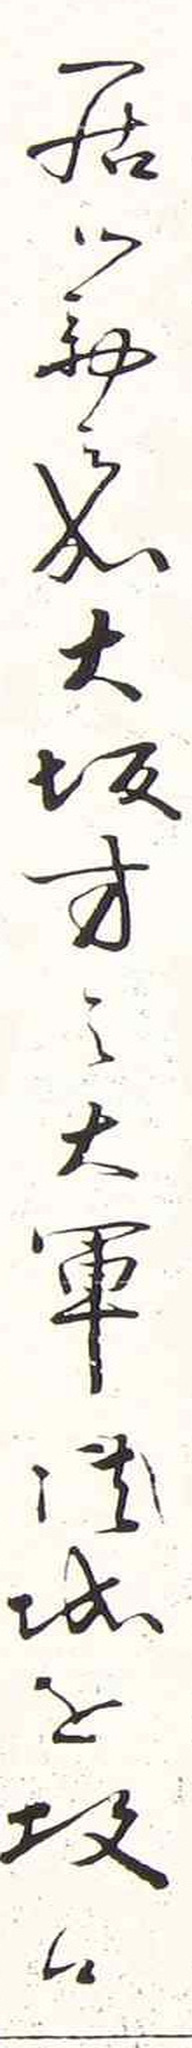居御勤ニ成大坂方之大軍御城を攻候
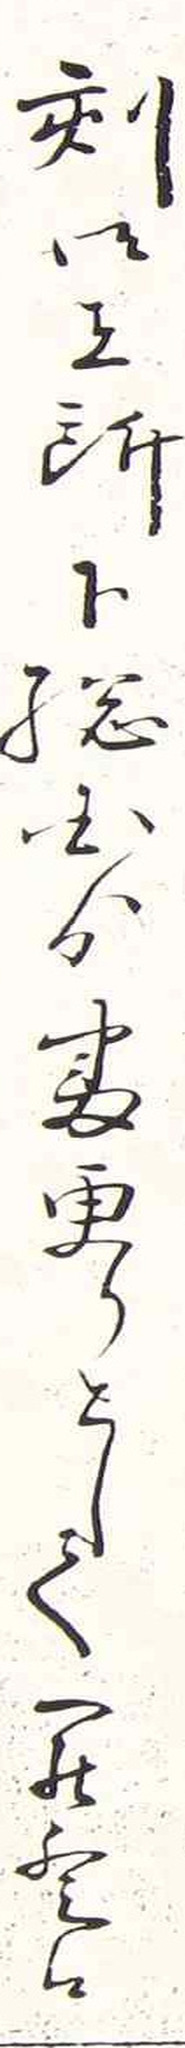刻御在所下総国ゟ番更りとして罷登候
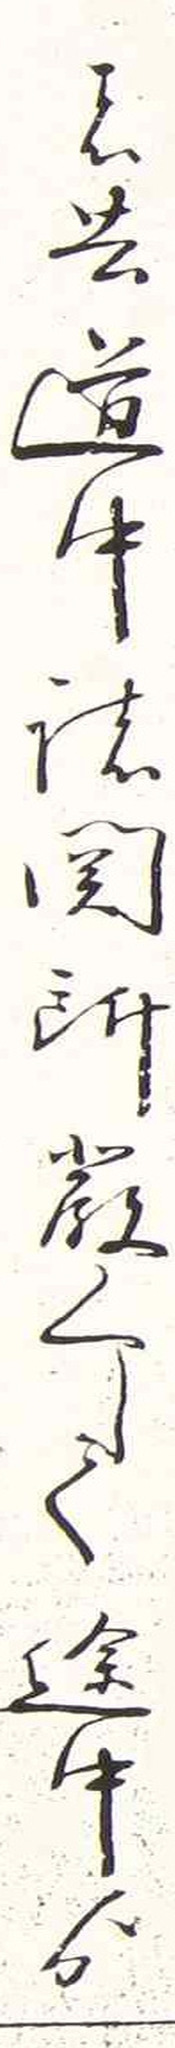者共道中諸関所厳くして途中ゟ

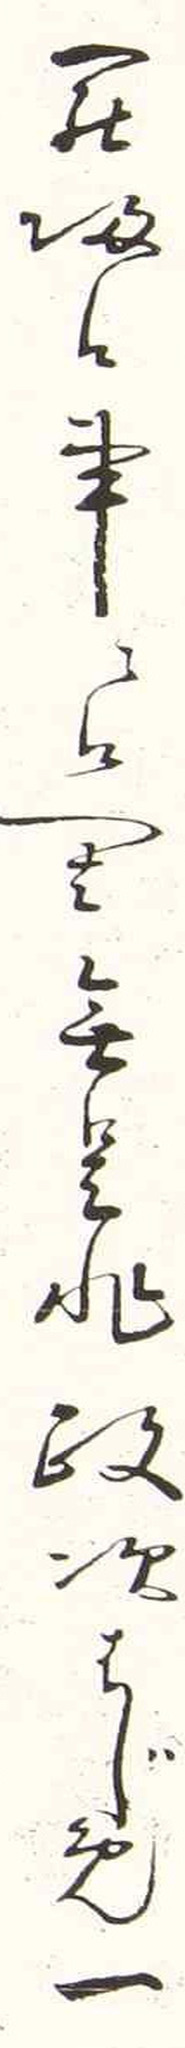罷帰候事ニ候へ者無是非政次はじめ一
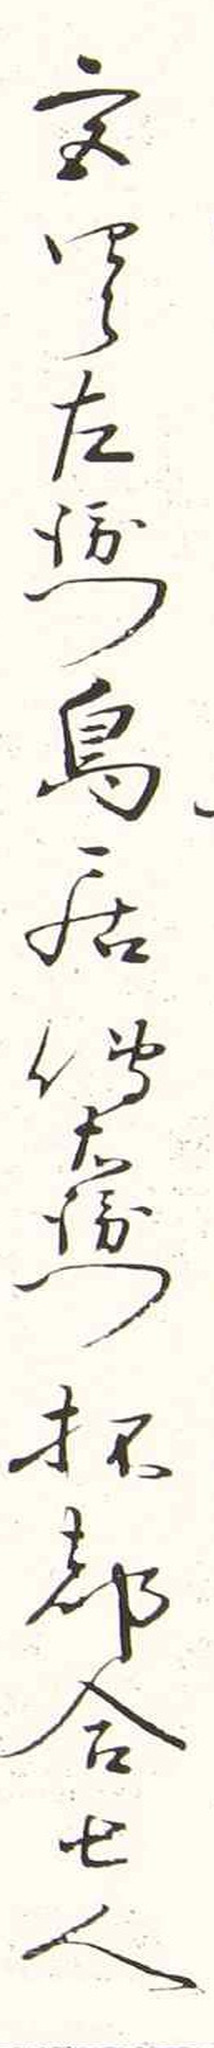宮四郎左衛門鳥居伝右衛門等都合七人
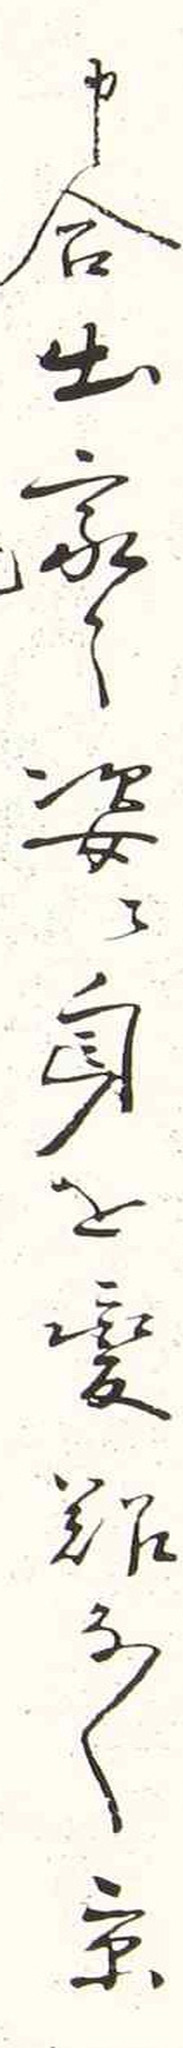申合出家之姿ニ身を変難なく京
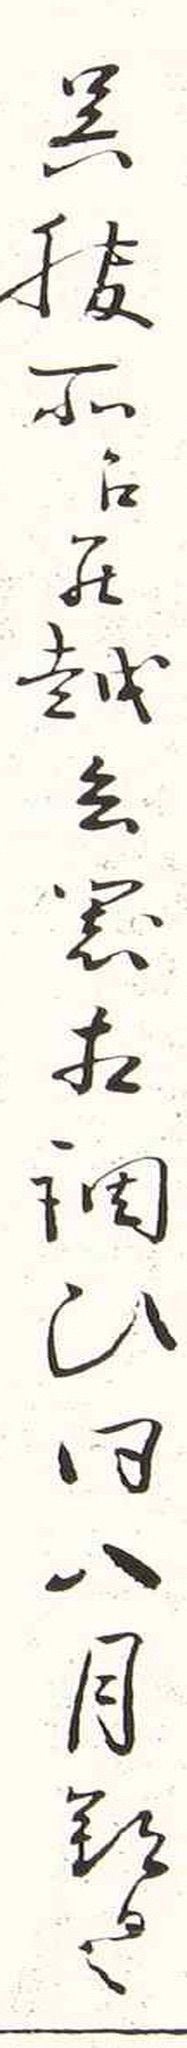呉服所江罷越兵器相調ひ同八月朔日之
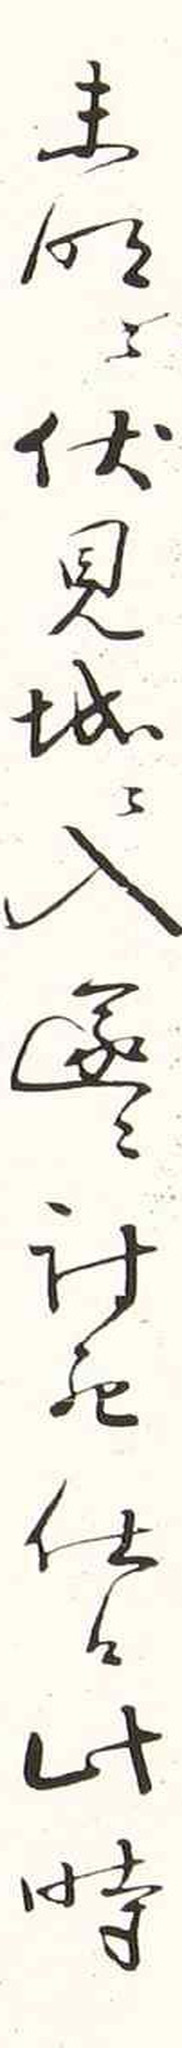未明ニ伏見城ニ入遂ニ討死仕候此時
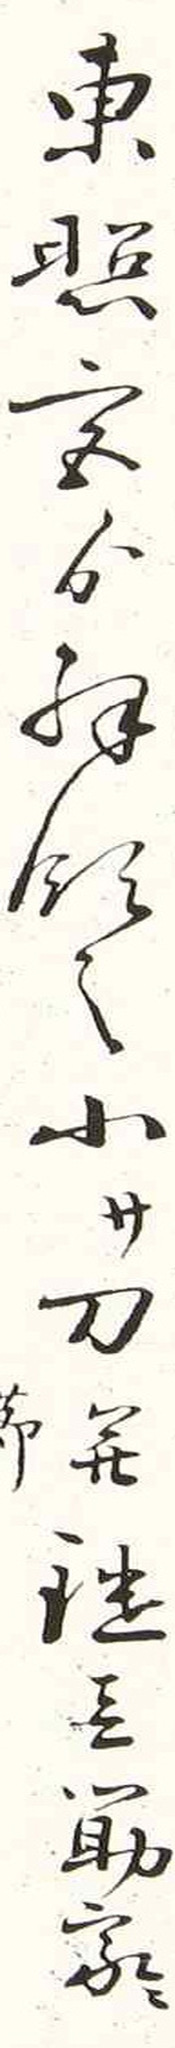東照宮ゟ拝領之小サ刀并鑓壱筋家ニ
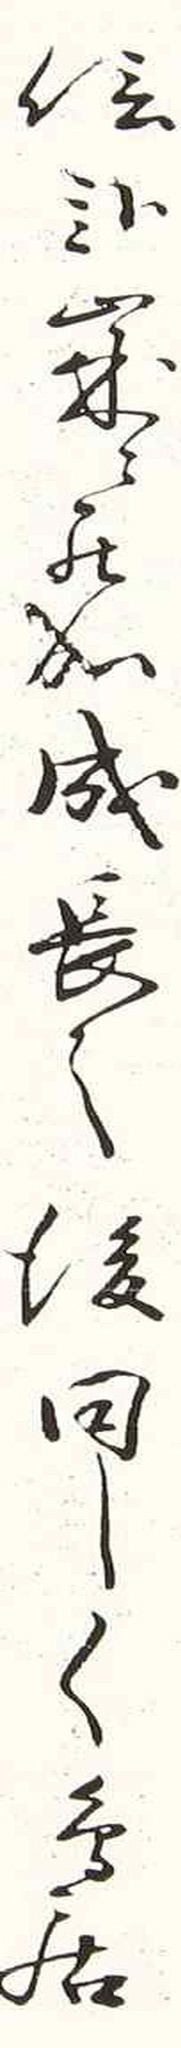信弐歳ニ罷成成長之後同しく鳥居
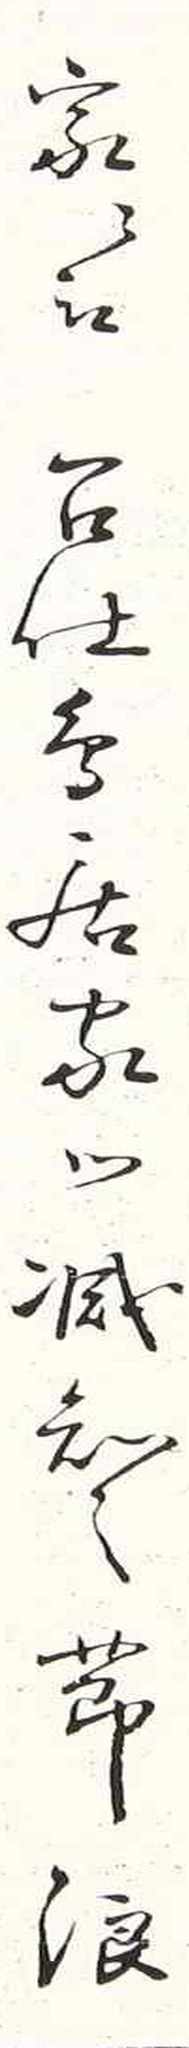家ニ被召仕鳥居家御減知之節浪
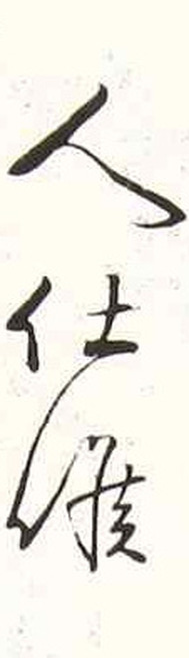人仕候
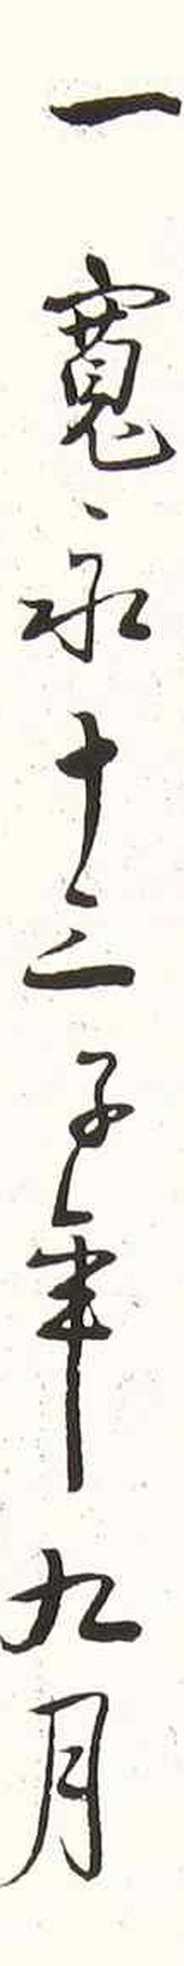一寛永十三子年九月
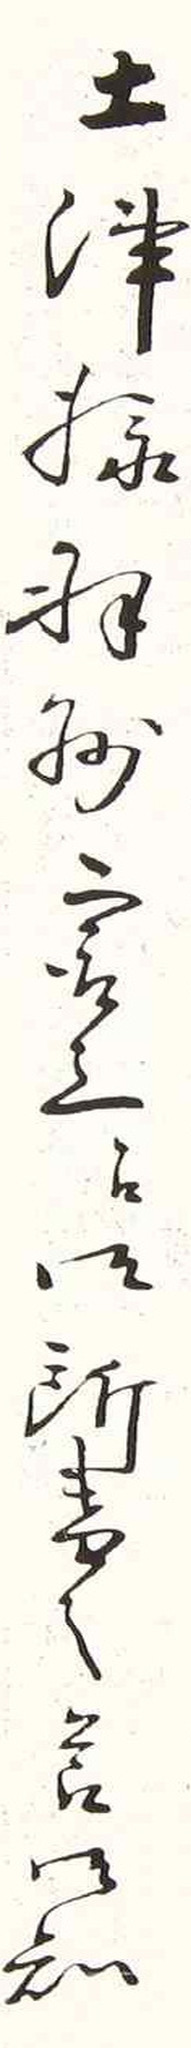土津様羽州最上江御所替之節御知
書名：諸士系譜　巻之357　す之部7
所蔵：会津若松市立会津図書館
